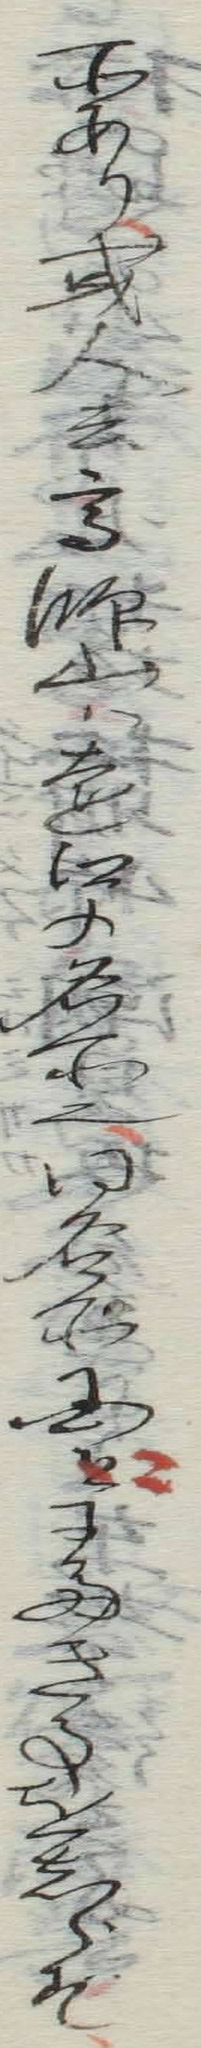所あり、或人云高師山は遠江の名所也、同名所国々に多き事をしらず、
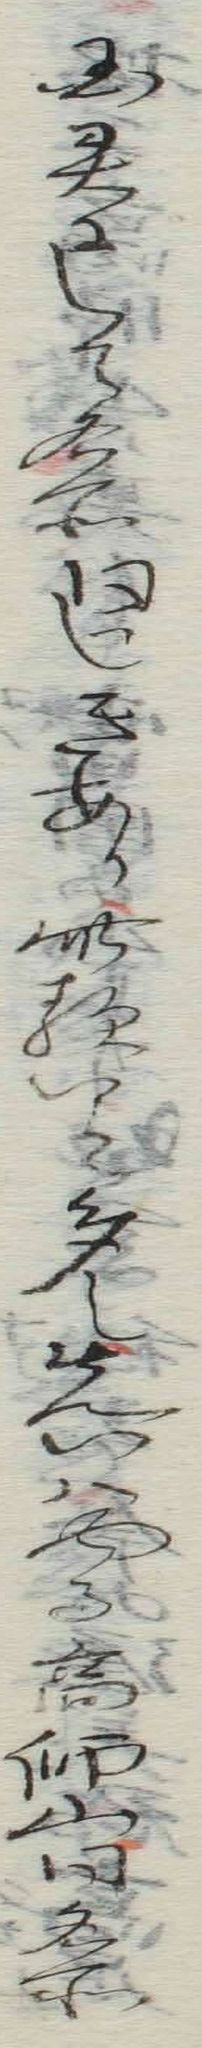国異にして名所同じきあり、此類いと多し先いはゆる高師山、同名所
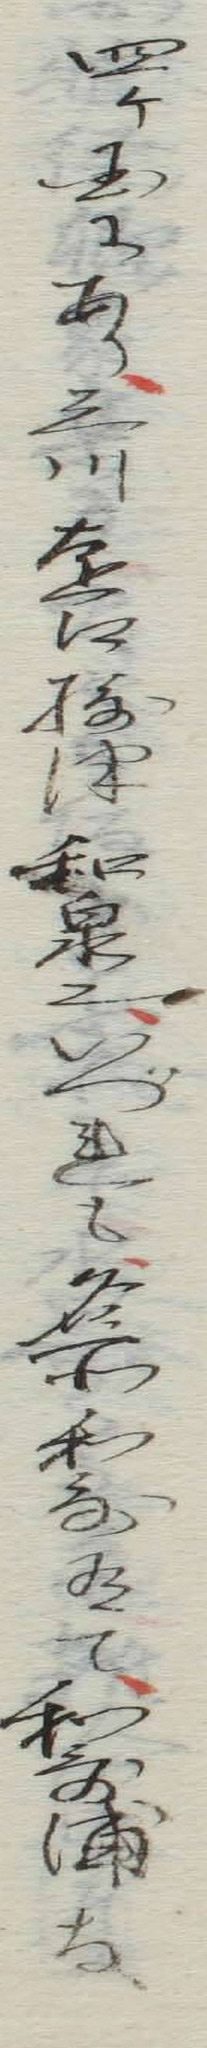四ケ国にあり、三川遠江摂津和泉也、いづれも名所和歌有て、和歌浦友
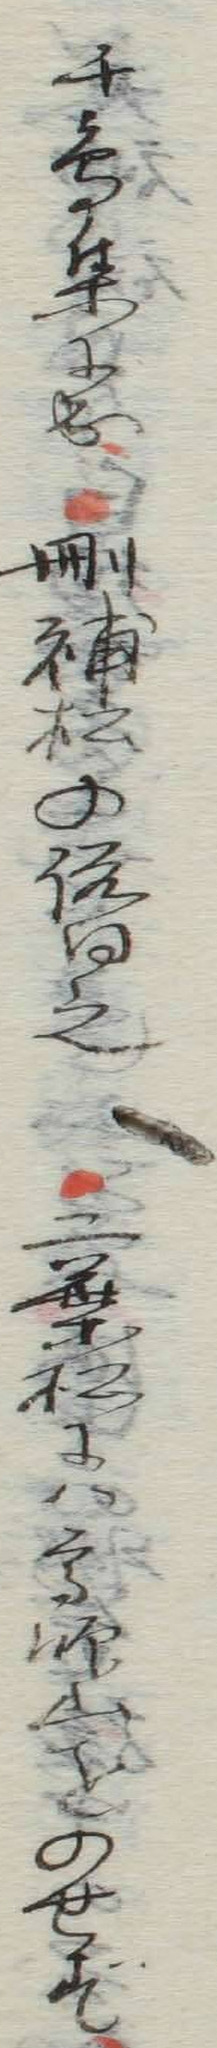千鳥集に出、●刪補松の説同之●二葉松には高師山をのせず、
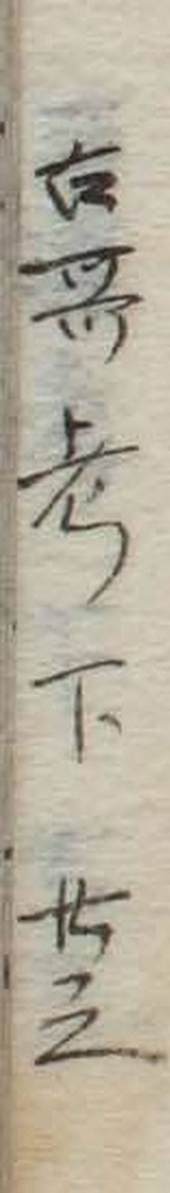古歌考下廿三

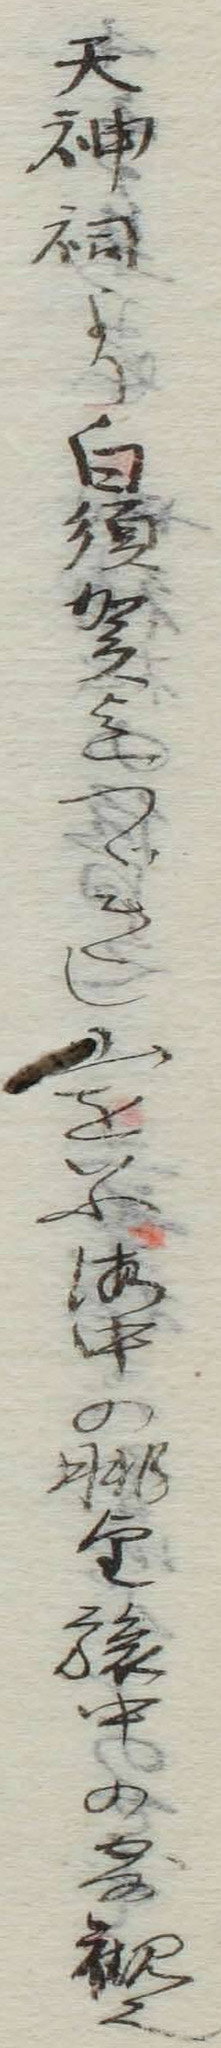天神祠より白須賀迄つゞきし山をいふ、海中の眺望旅中の奇観也
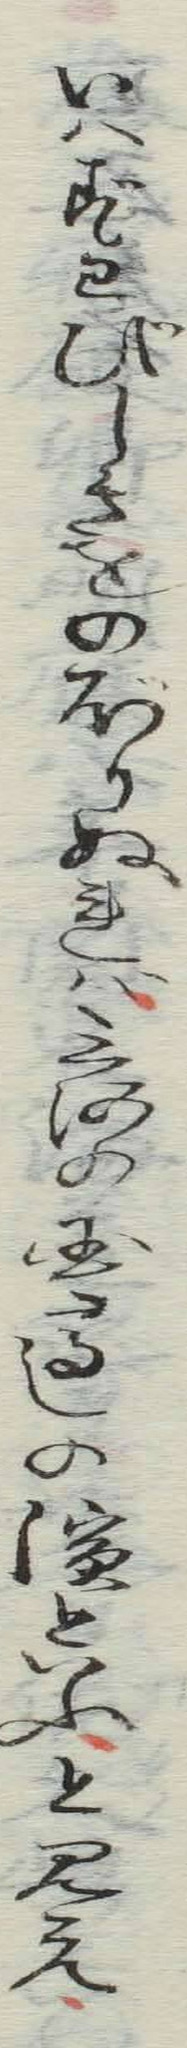いはずわびしきをのぼりぬれば、三河の国高しの濱といふ、と見え、
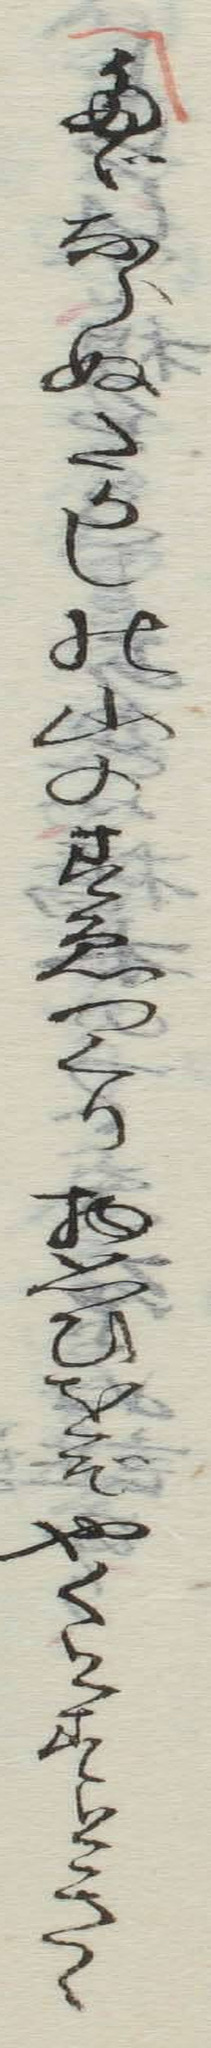〽たゞならぬたかしの山のすゑつくり物思ひをぞやくとすときく
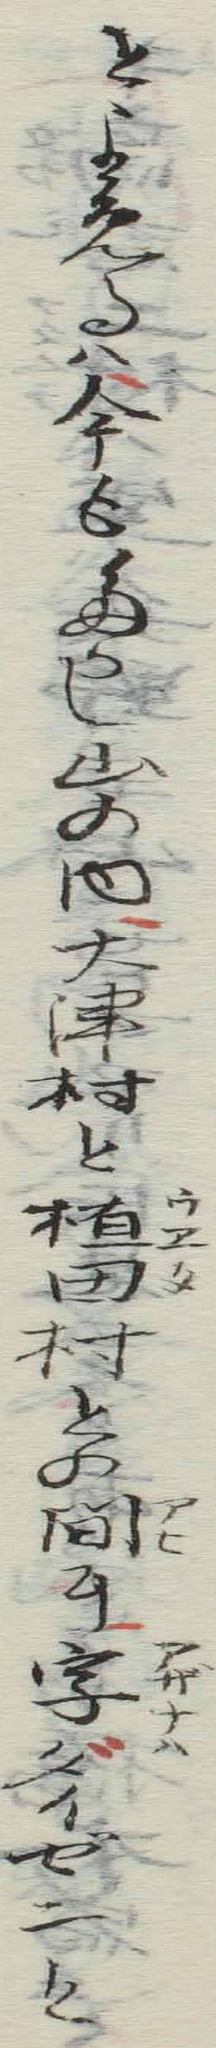とよめるは、今もたかし山の内、大津村と植田村との間に、字ダイゼンと
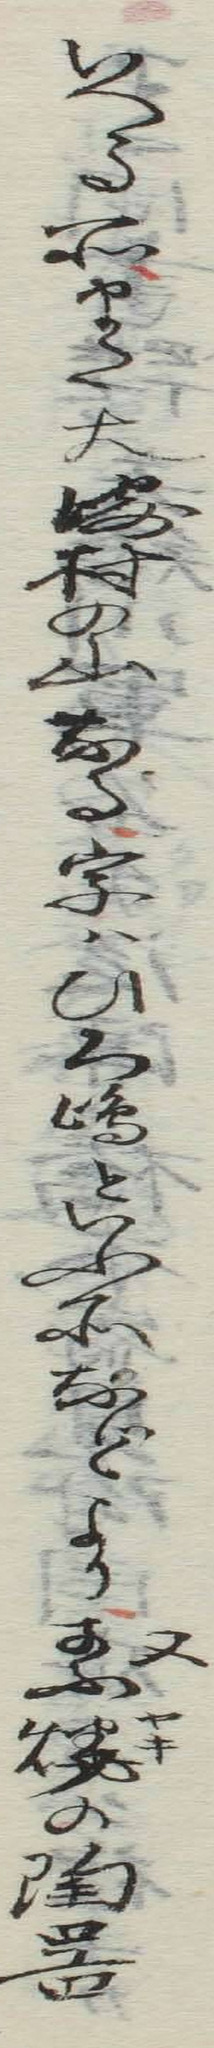いへる所、また大崎村の山なる、字はひろ嶋といふ所などより、素焼の陶器
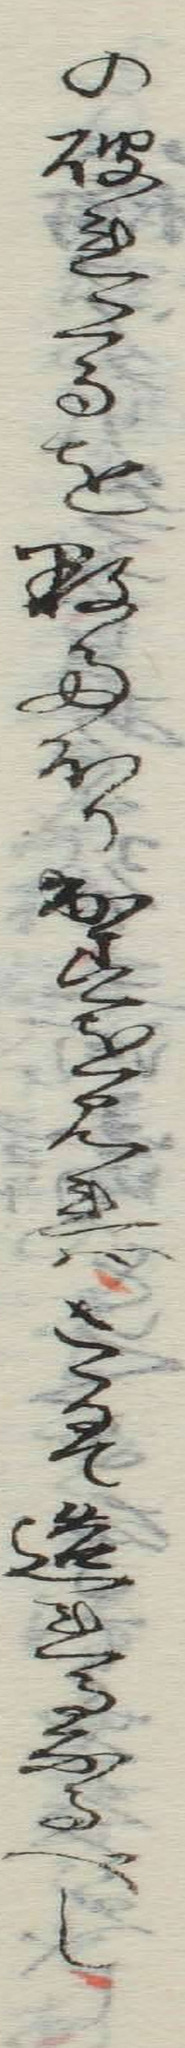の破れたるを数多ほり出すを見れば、こゝにて造れるなるべし、
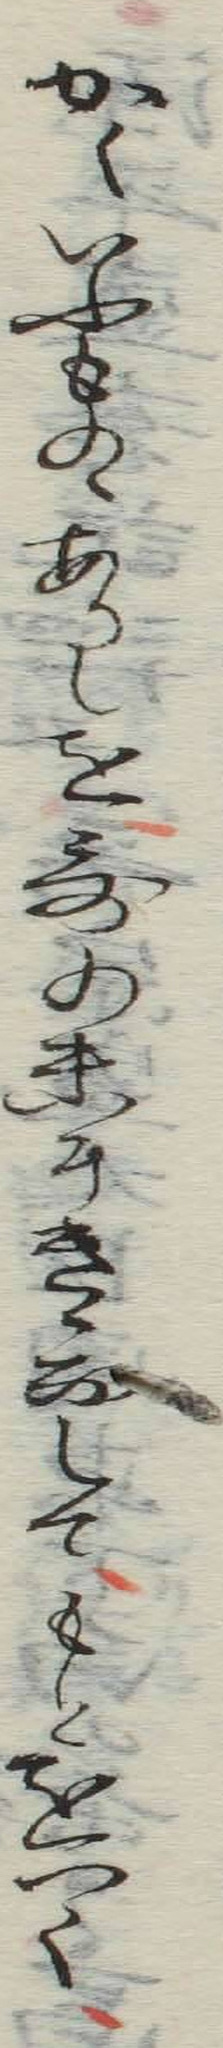かくいふものゝありしを、歌の末にきゝなして、もとをつく、
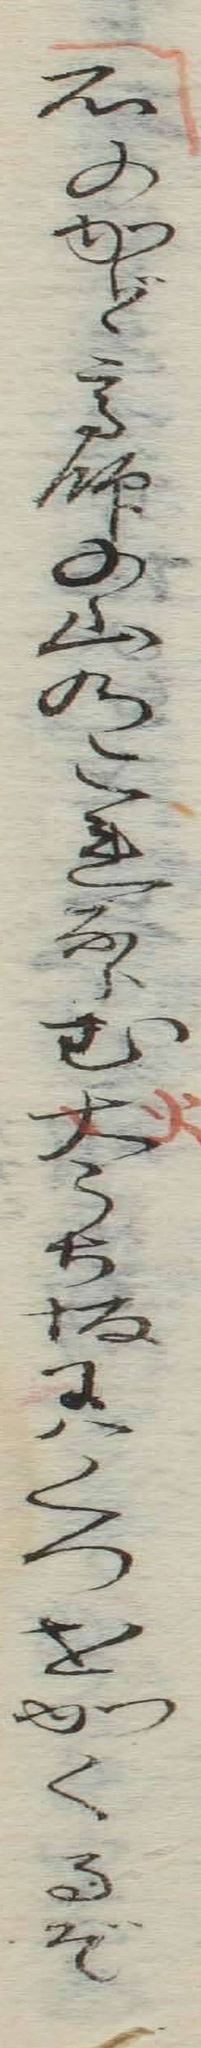〽石のかど高師の山のこれならむ火うち坂にはくつをかくるぞ
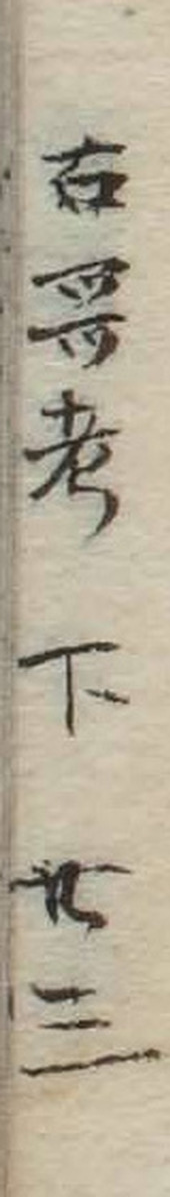古歌考下廿三

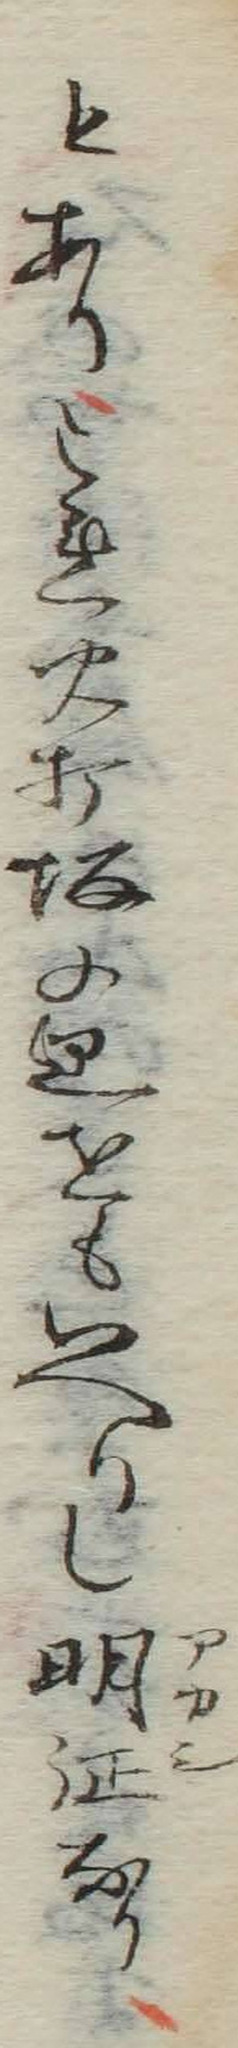とあり、これ火打坂の辺をもいへりし明証なり、
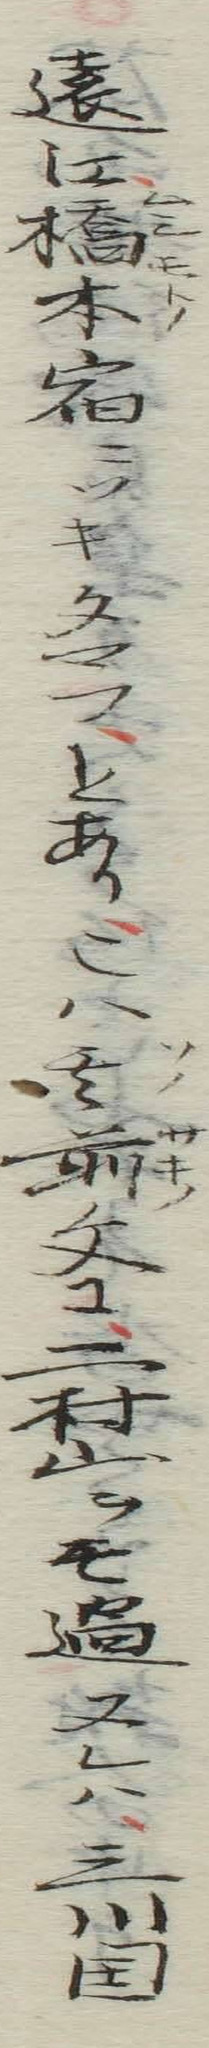遠江橋本宿ニツキタマフ、とあり、こは其前文に、二村山ヲモ過ヌレバ、三川国
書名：三河国古跡考
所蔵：国文学研究資料館
